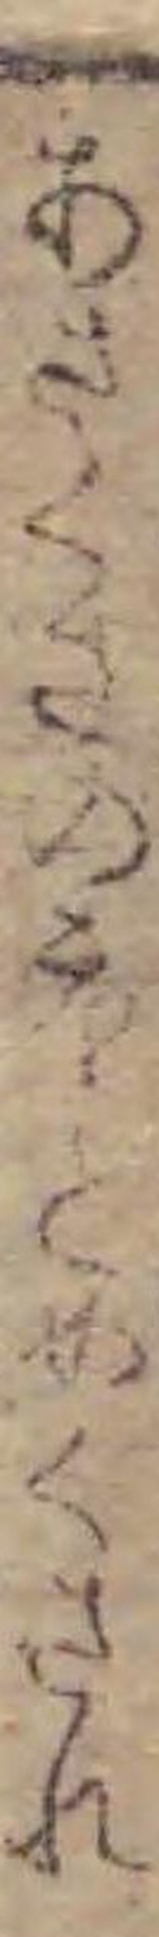あさくさの市とめくされ
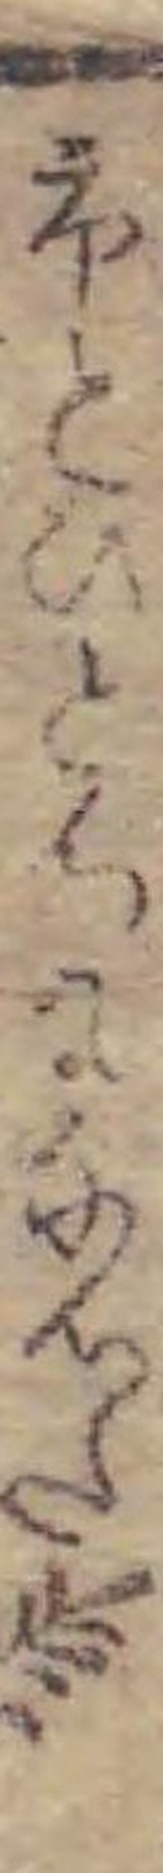市とひとつになつた
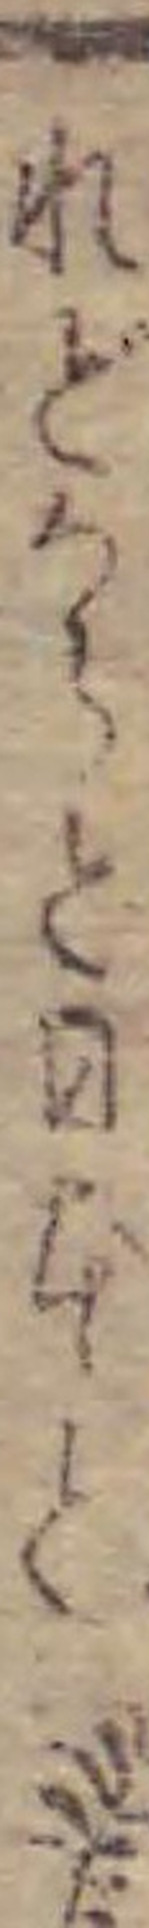れどからと日本と
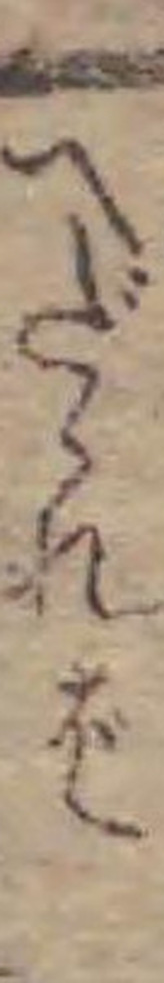へだゝれば
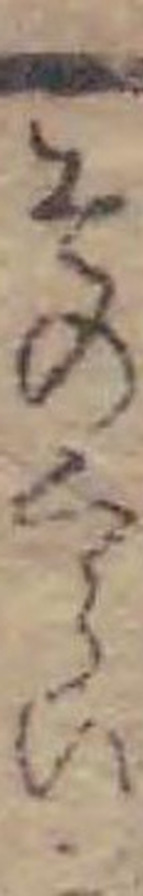そのくらい
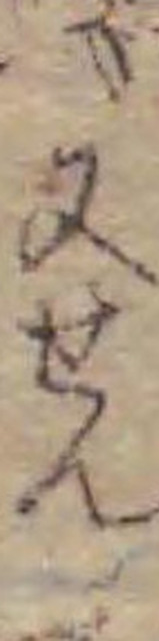又せん
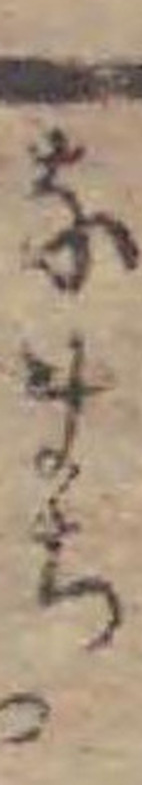なまち
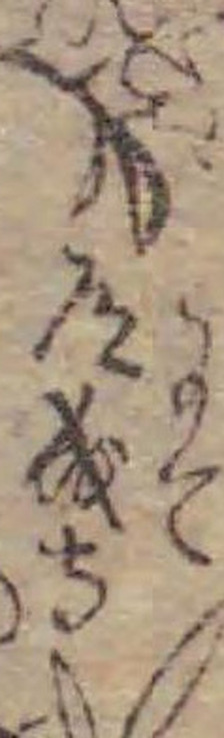道成寺
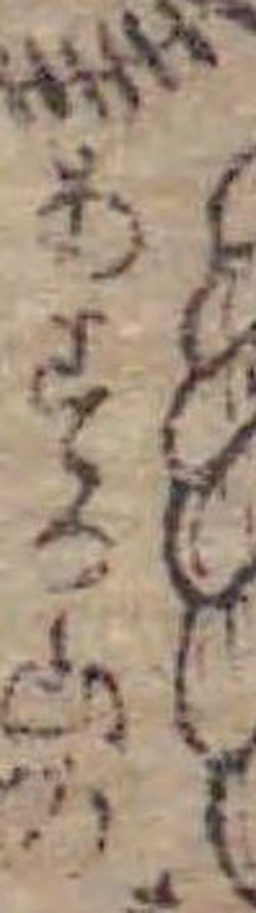あすか山の
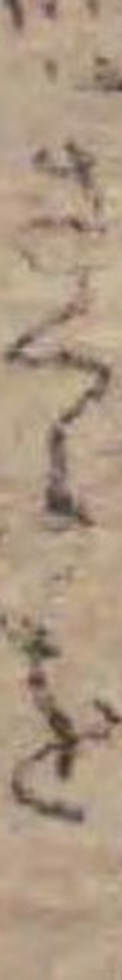さくらを
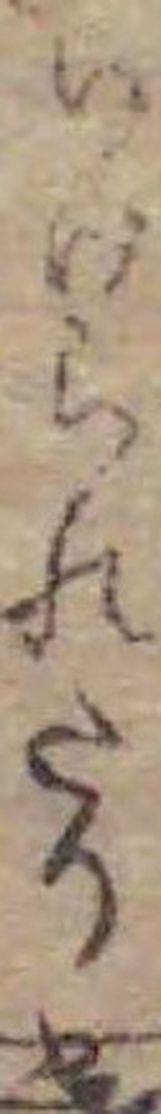いけられたり
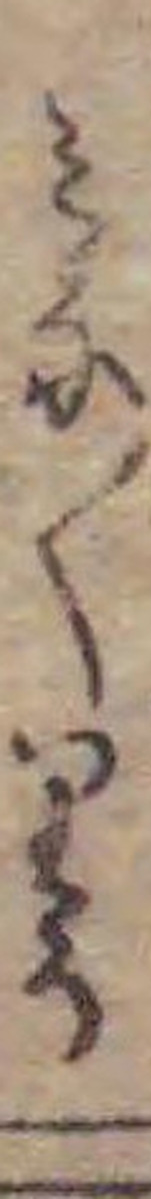みな〳〵りう

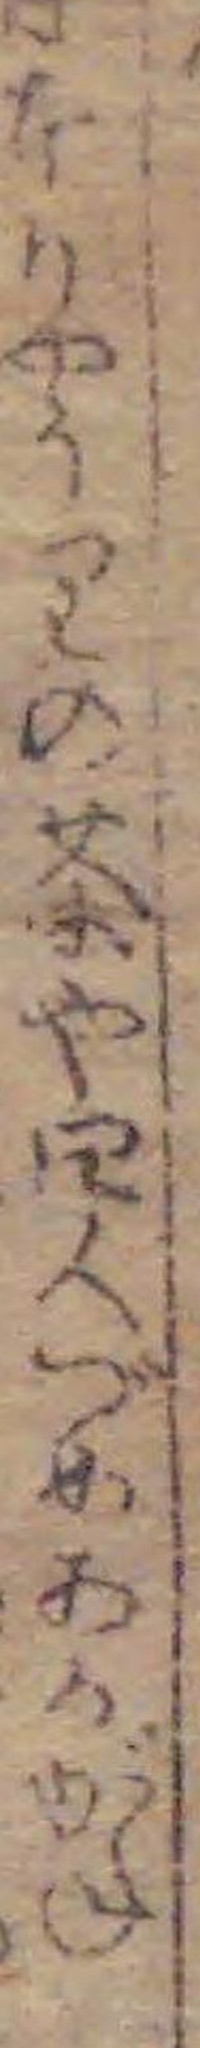日本りやうりの茶や四人づめあかがね
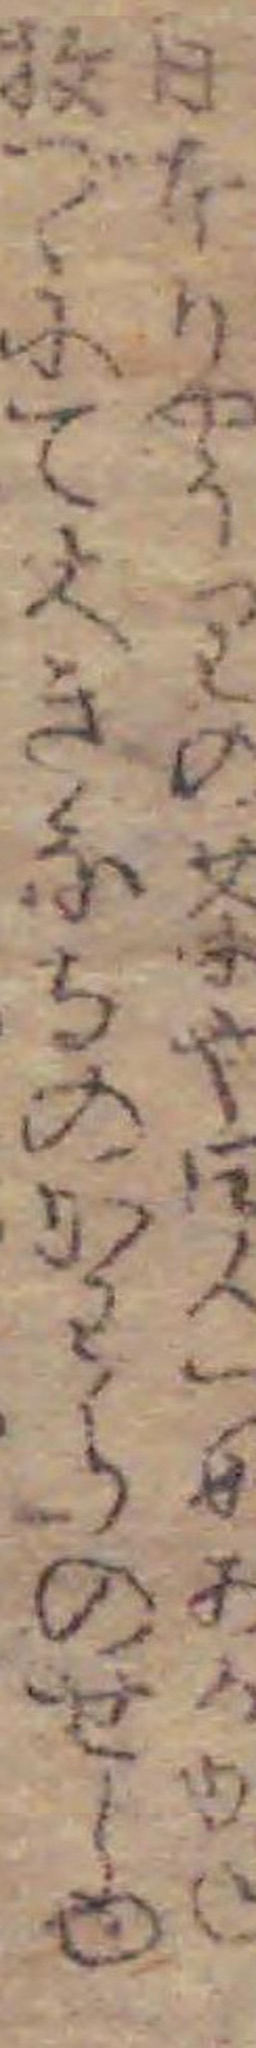一枚づゝにて大きな寺のかわらのせしゆ
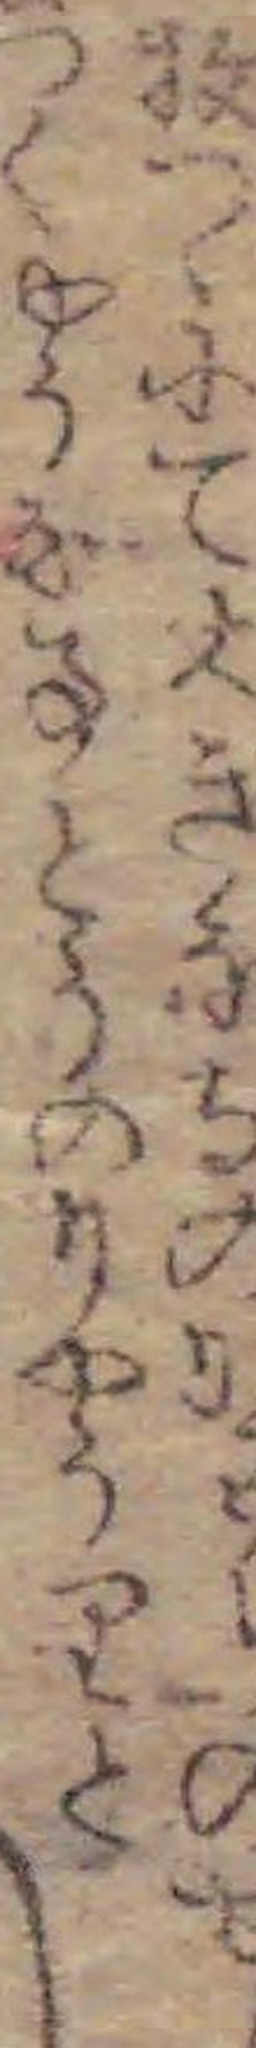につくやうな事とうのりやうりと
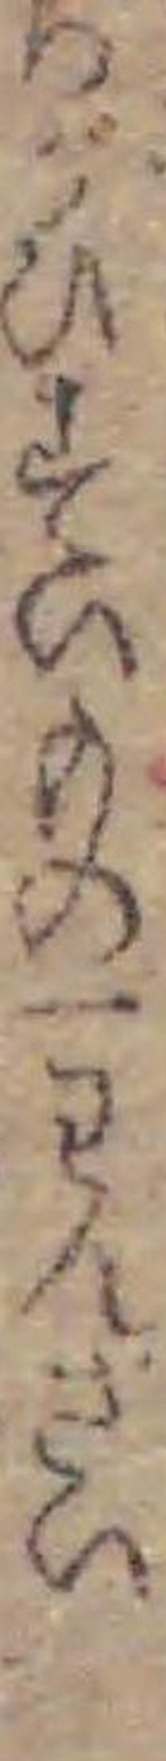ちがひすいもの一わんさい
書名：此奴和日本 : 2巻
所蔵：国立国会図書館 National Diet Library, JAPAN
